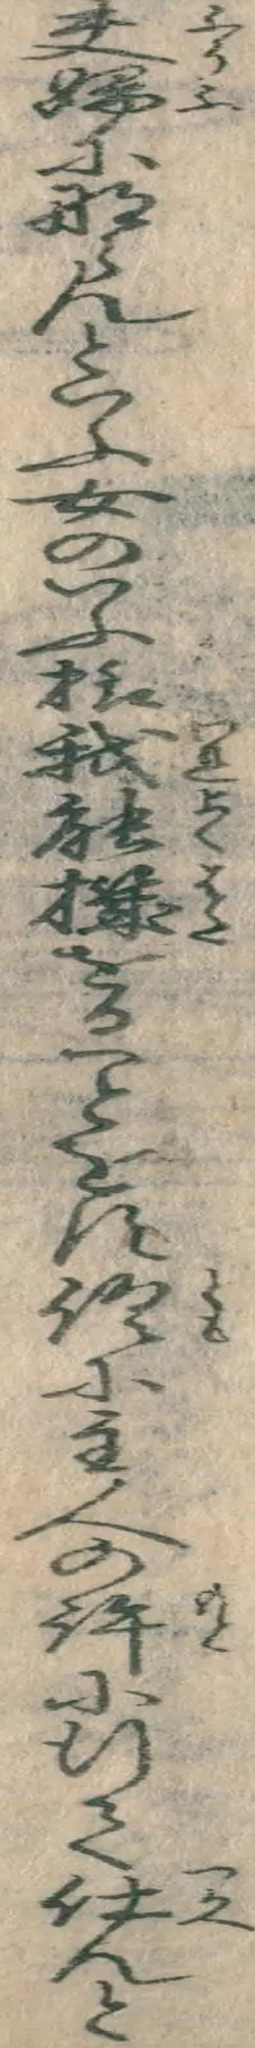夫婦にならんといふ女のいふ様我能機をることをす倶に主人の許に行て仕んと
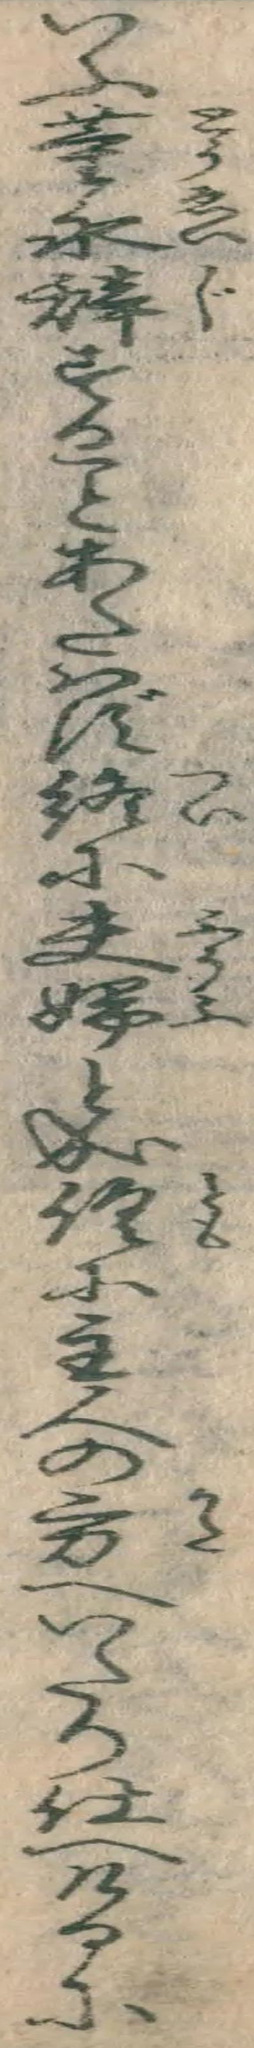いふ董永辞することあたばず終に夫婦と成倶に主人の方へいたり仕へけゐに
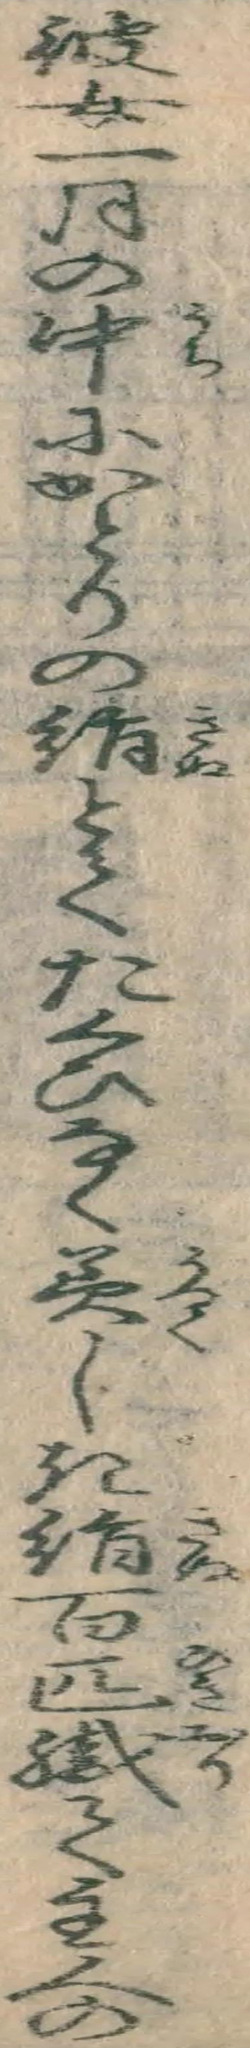彼女一月の中にかとりの絹とてたくひなく美しき絹百匹織て主人の

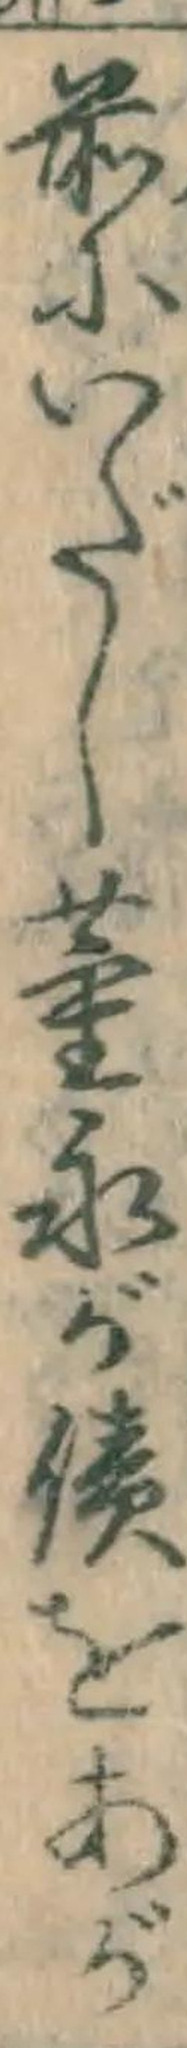前にいだし董永が債をあが
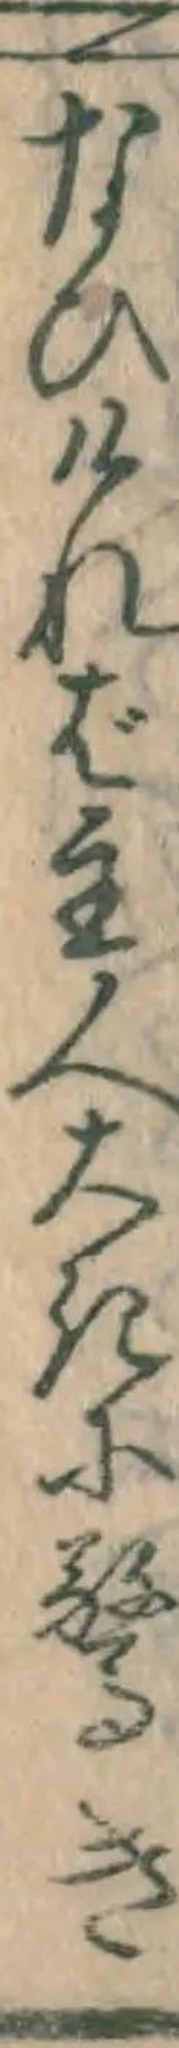なひければ主人大きに驚き
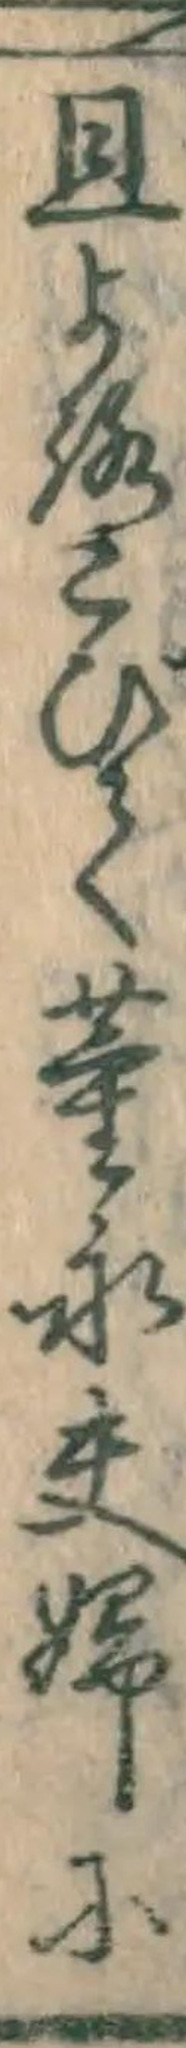且よろこびて董永夫婦に
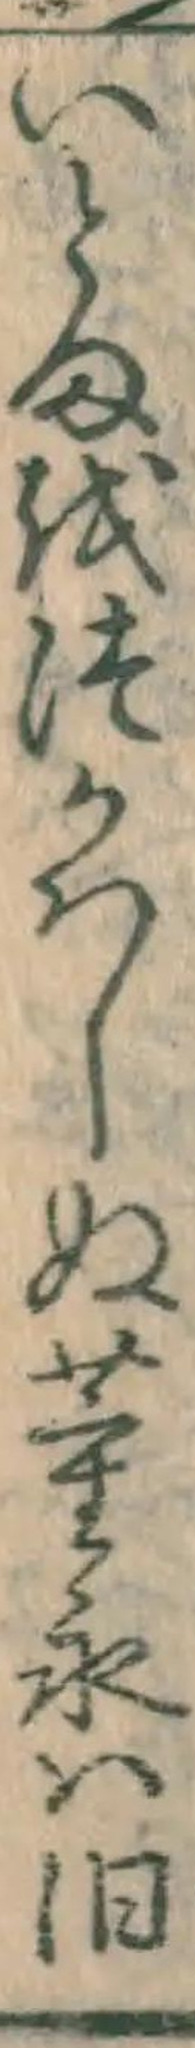いとまをつかはしぬ董永は旧
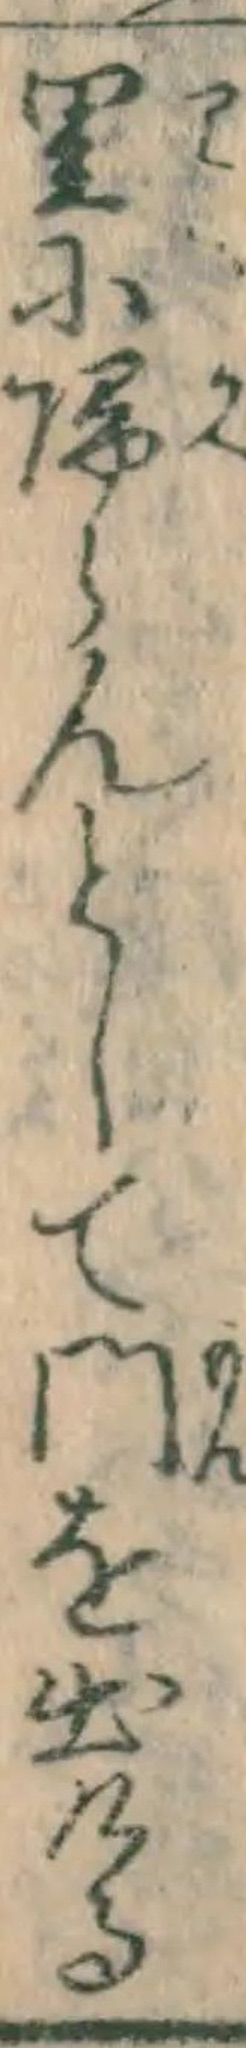里に帰らんとして門を出ける
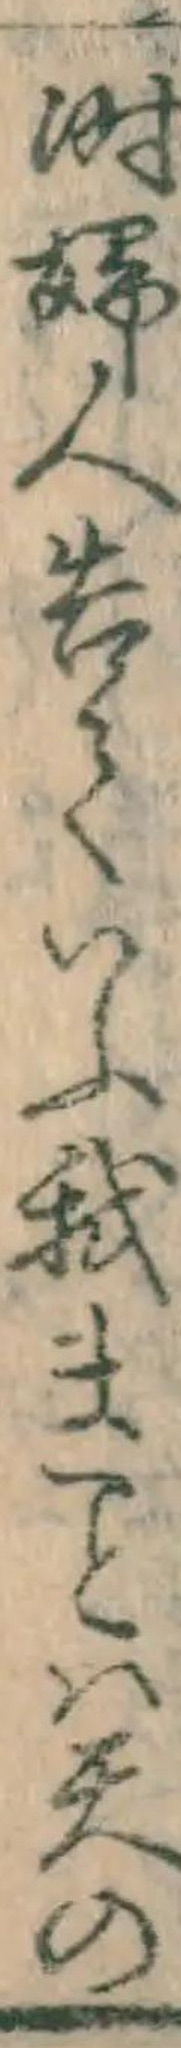時婦人告ていふ我まことは天の
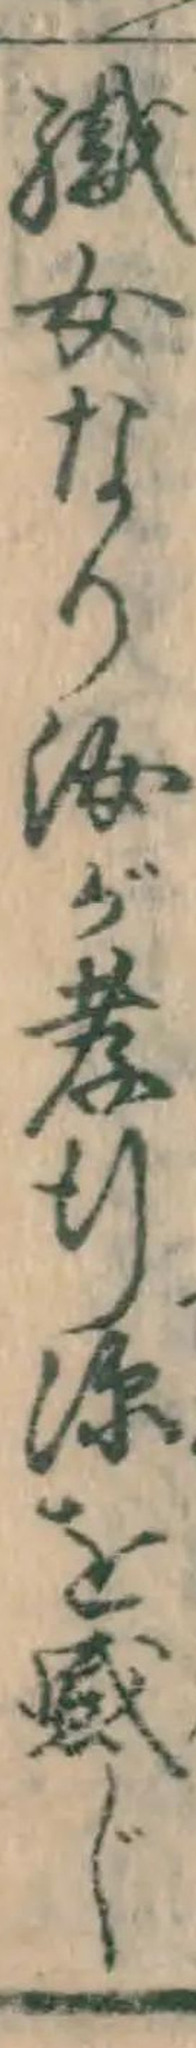織女なり汝が孝行深を感じ
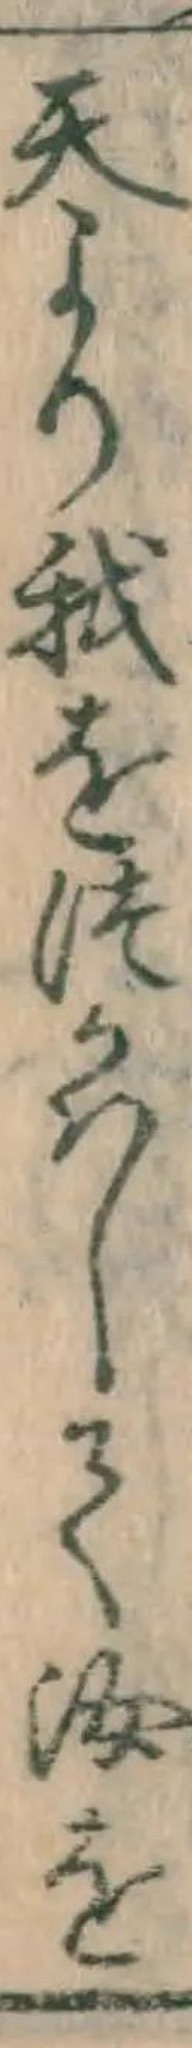天より我をつかはして汝を
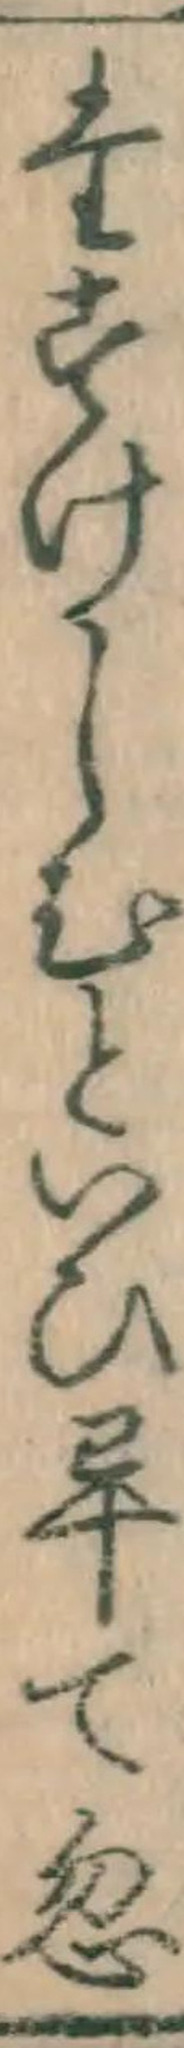たすけしむといひ畢て忽
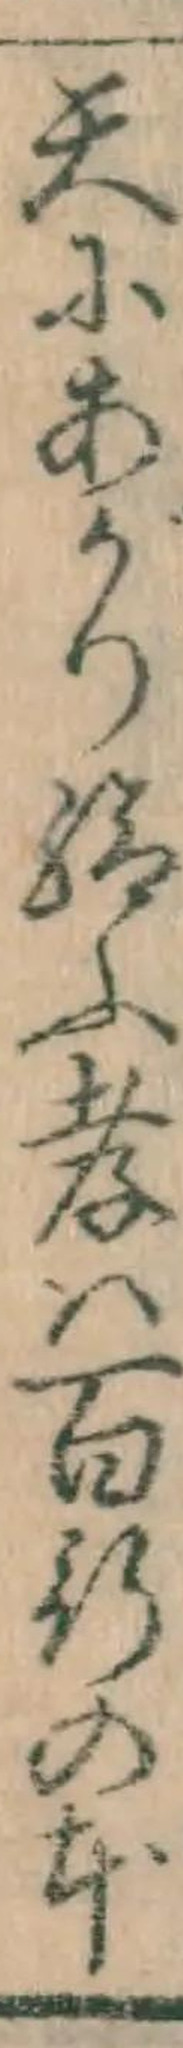天にあがり給ふ孝は百行の本
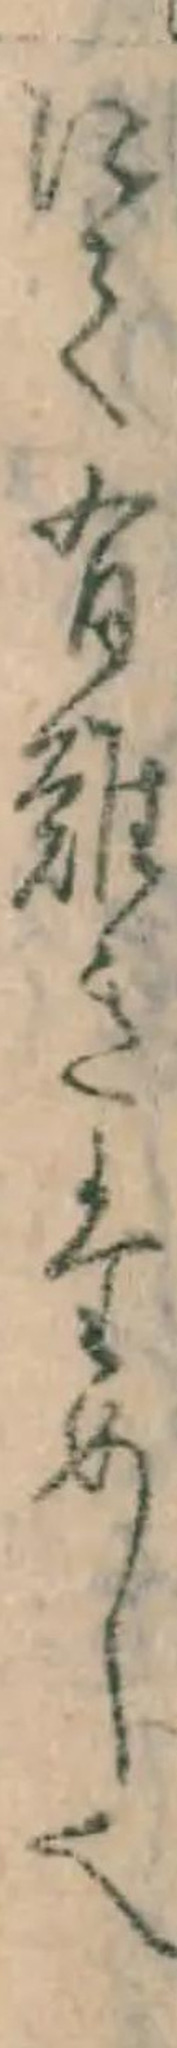にて有難きためし也
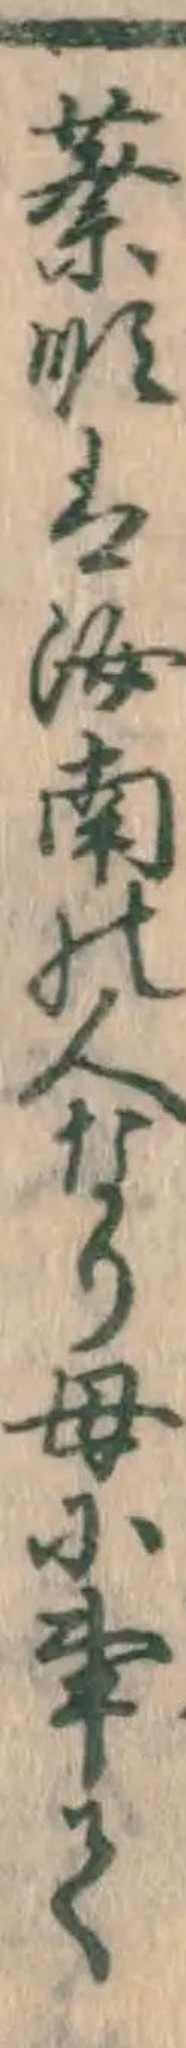蔡順は汝南の人なり母に事て
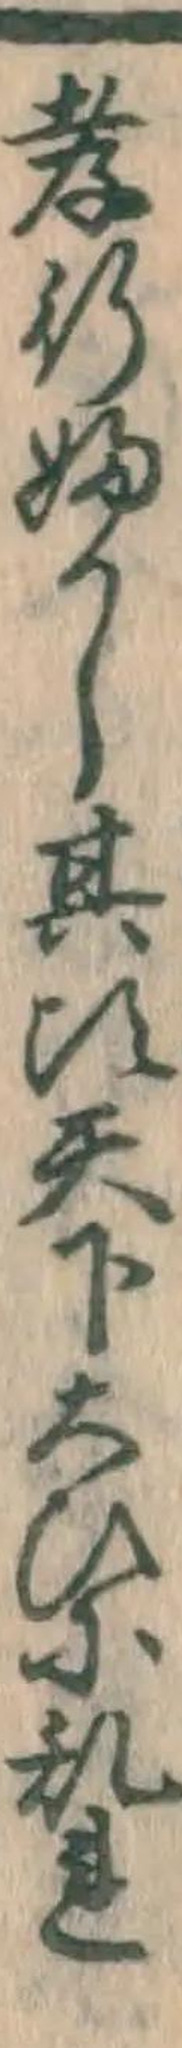孝行ふかし其頃天下大ひに乱れ
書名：養蚕秘録 3巻. [3]
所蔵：国立国会図書館 National Diet Library, JAPAN
